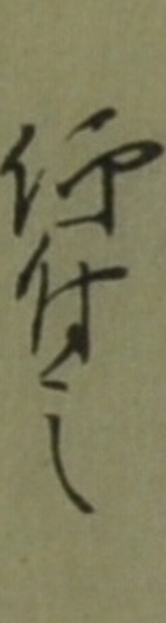仰付之
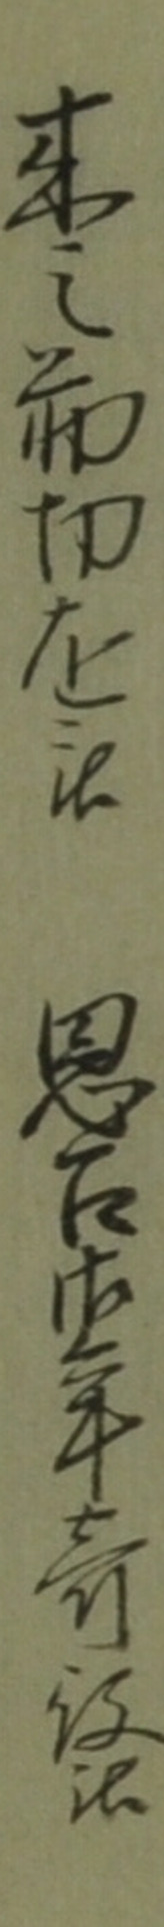来之勤切を被思召御年寄役被
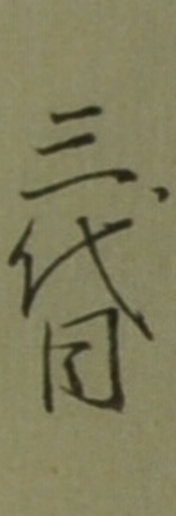三代目
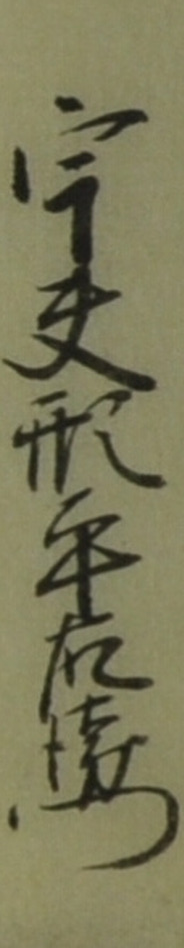宇夫形平右衛門

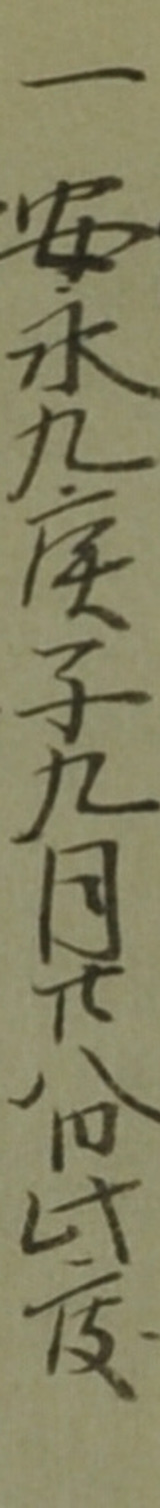一安永九庚子九月廿八日此度
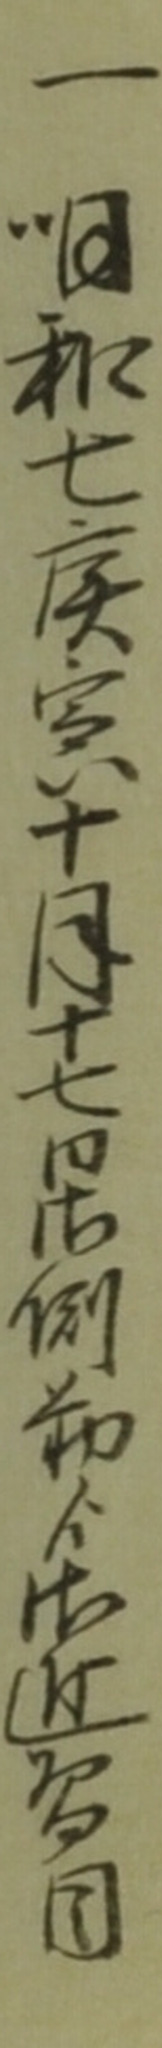一明和七庚寅十月十七日御側勤ゟ御近習目
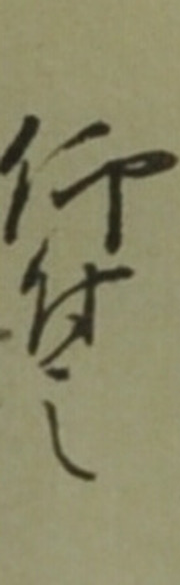仰付之
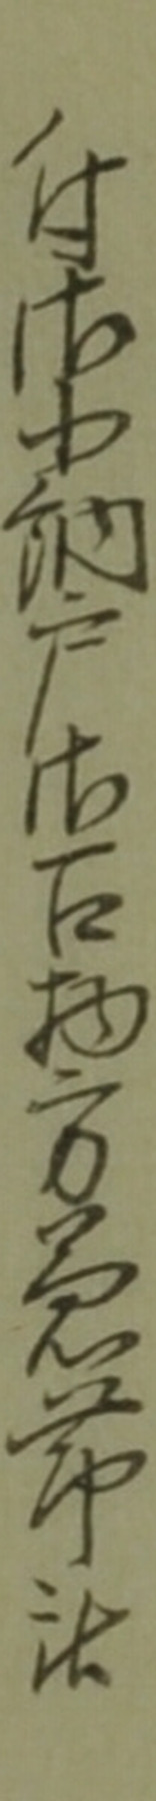付御小納戸御召物方兼帯被
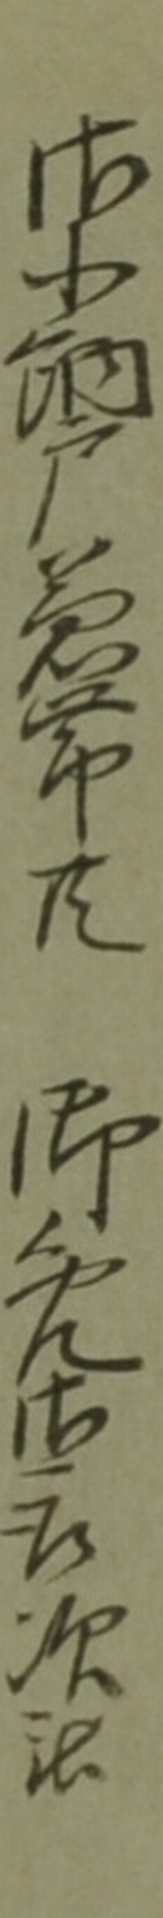御小納戸兼帯共御免御取次被
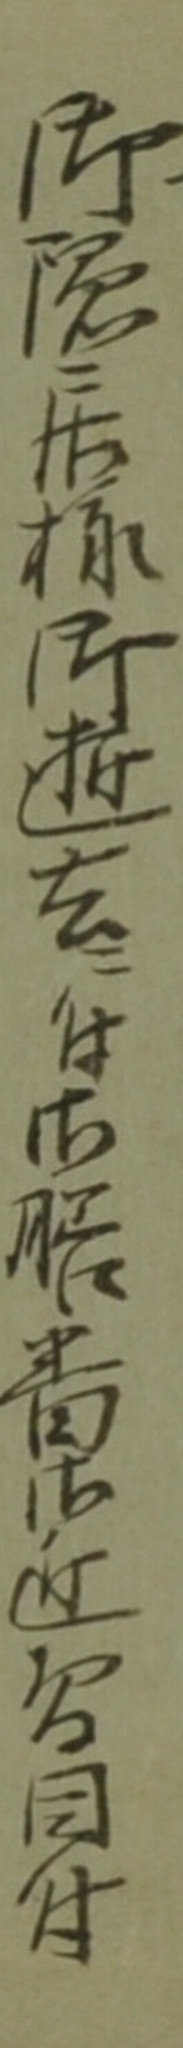御隠居様御逝去ニ付御膳番御近習目付
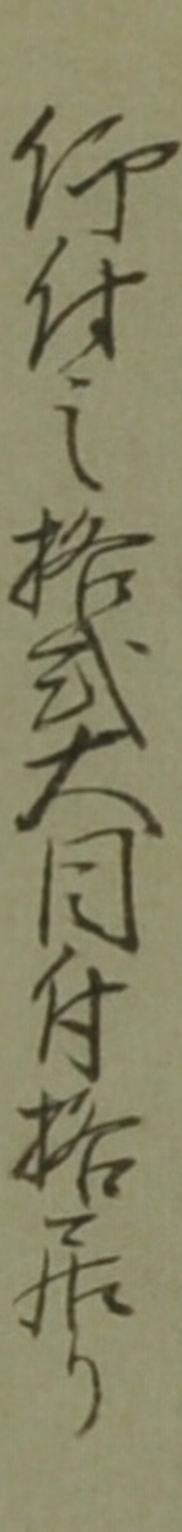仰付之格式大目付格居リ
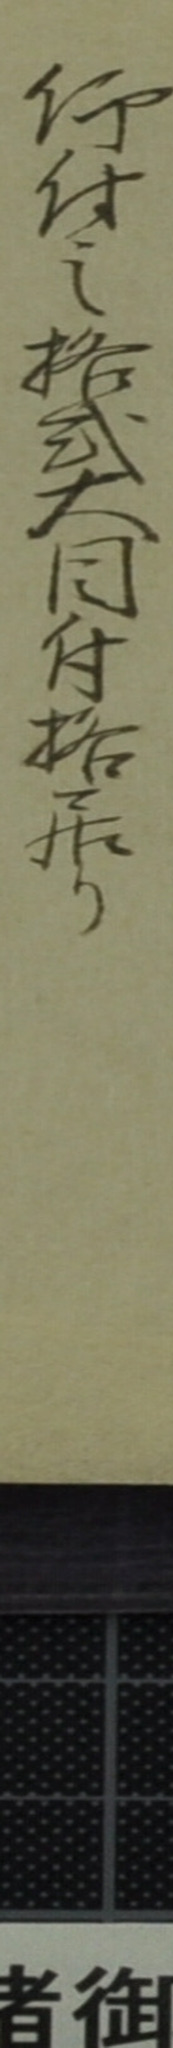仰付之格式大目付格居リ
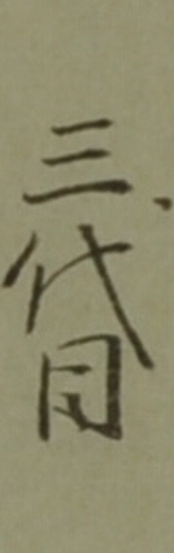三代目
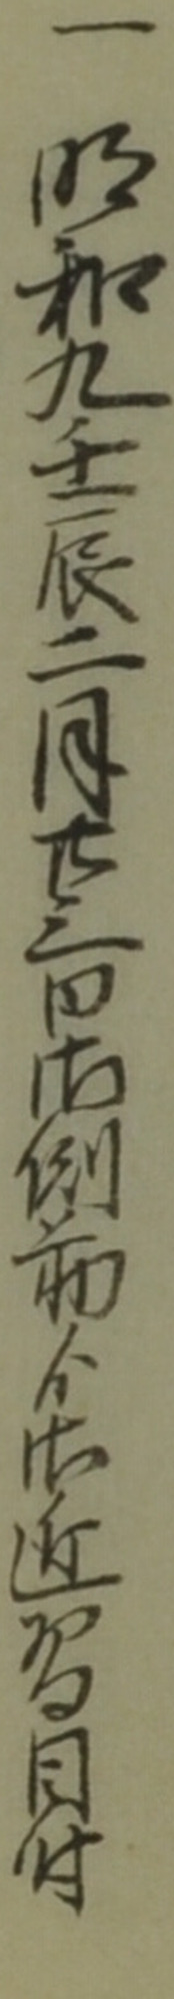一明和九壬辰二月廿三日御側勤ゟ御近習目付
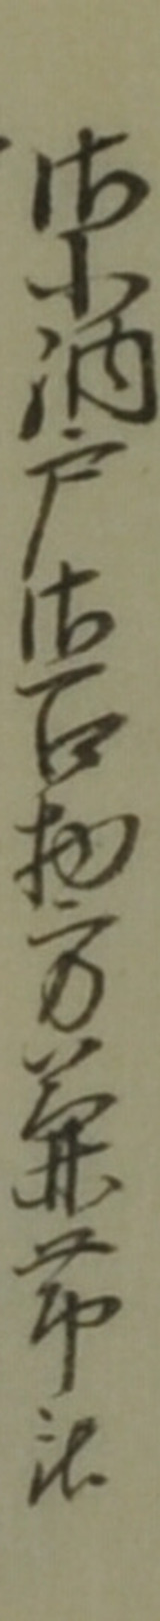付御小納戸御召物方兼帯被
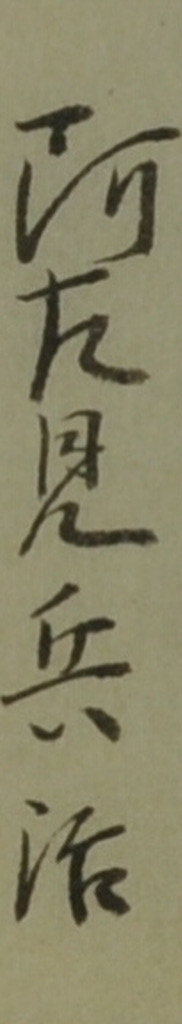阿左見兵治
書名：諸御役代々録（四）
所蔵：伊那市立高遠町図書館・合同会社AMANE
